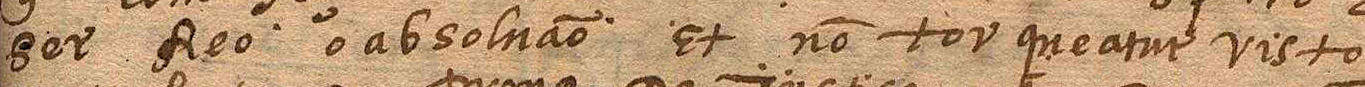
ser Reo o absoluão Et nō torqueatur visto
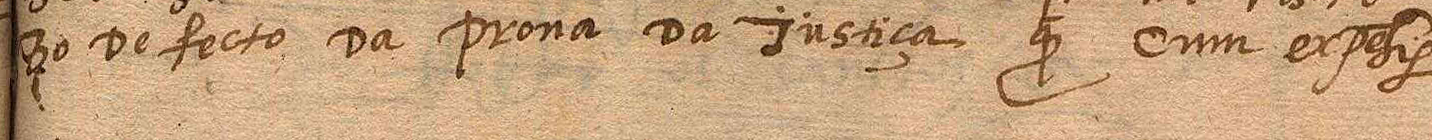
ho defecto da proua da Iustiça ꝙ̄ cum expēsis
